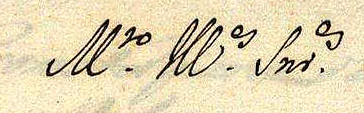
M.to Ill.es Snr.es
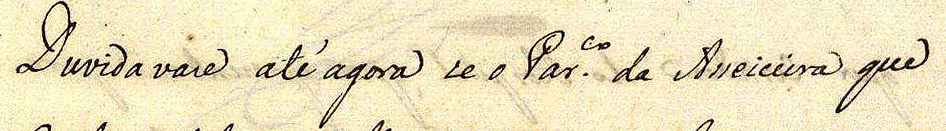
Duvida vaie até agora se o Par.co da Asseiceira que
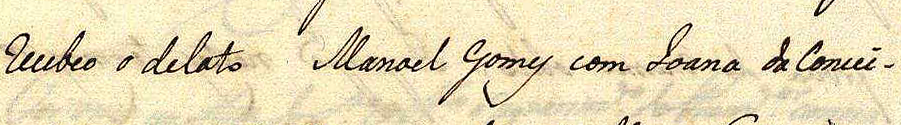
Recebeo o delato Manoel Gomes com Ioana da Concei
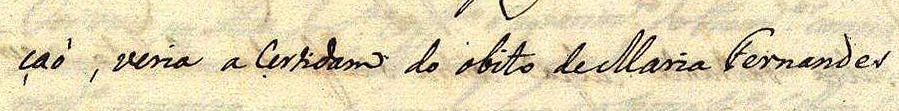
çaõ, veria a Certidam do obito de Maria Fernandes
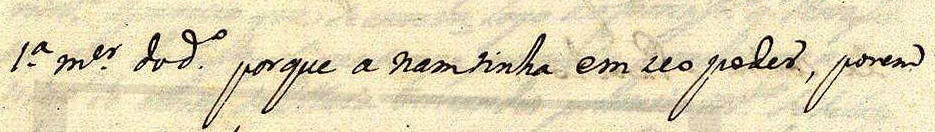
1.a m.er do d.o porque a nam tinha em seo poder, porem
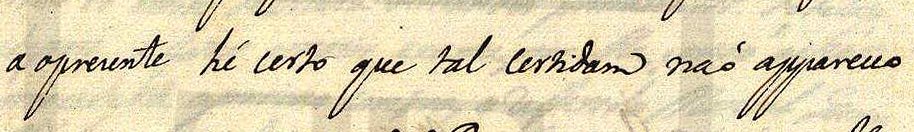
ao prezente hé certo que tal certidam naõ appareceo
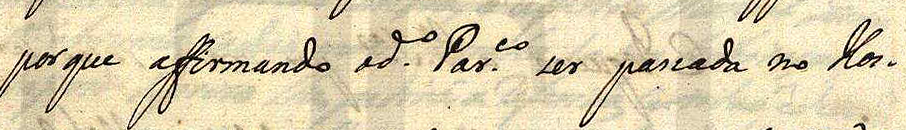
porque affirmando o d.o Par.co ser passada no Hos
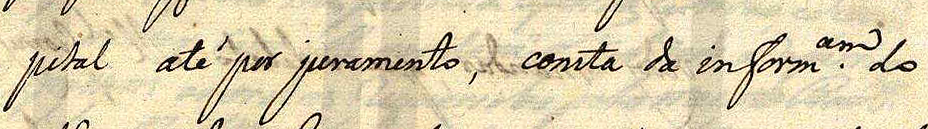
pital até por juramento, consta da inform.am do
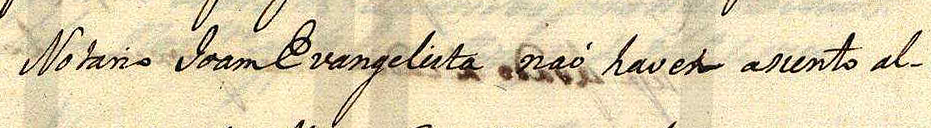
Notario Ioam Evangelista naõ haver assento al
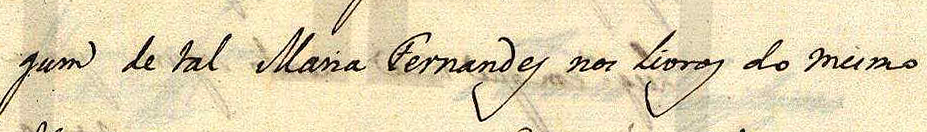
gum de tal Maria Fernandes nos Livros do mesmo
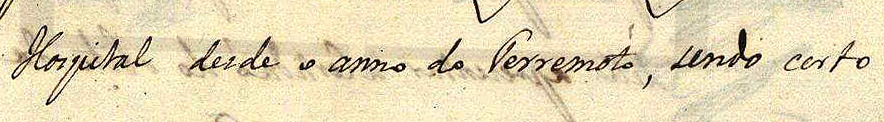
Hospital desde o anno do Terremoto, sendo certo
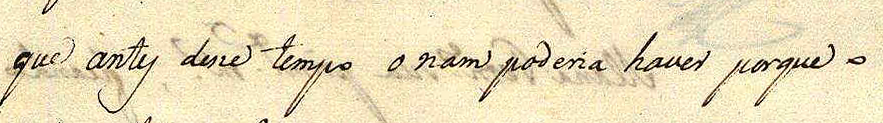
que antes desse tempo o nam poderia haver porque o
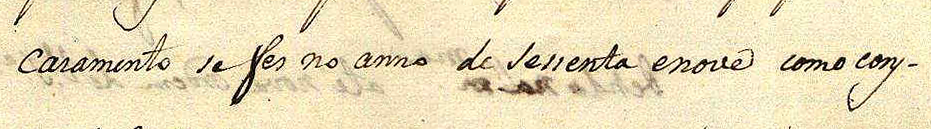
cazamento se fes no anno de sessenta e nove como cons
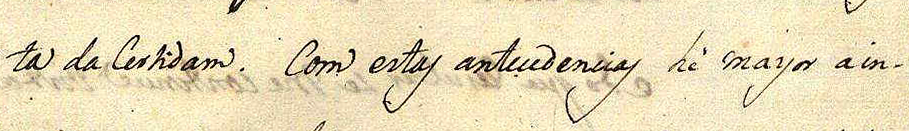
ta da Certidam. Com estas antecedencias hé mayor a in
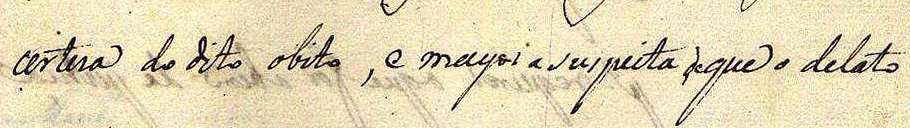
certeza do dito obito, e mayor a suspeita de que o delato
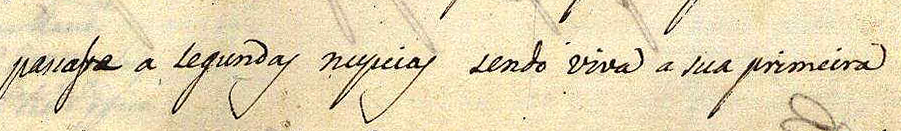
passasse a segundas nupcias sendo viva a sua primeira
